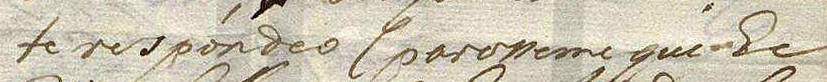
te respondeo (paresseme que he
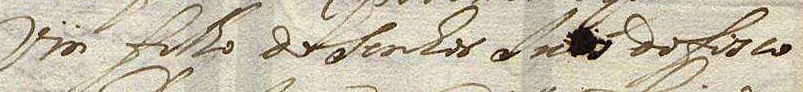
Vm filho do Senhor Iuis do fisco
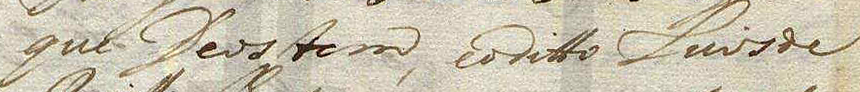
que Deos tem, e o ditto Luis de
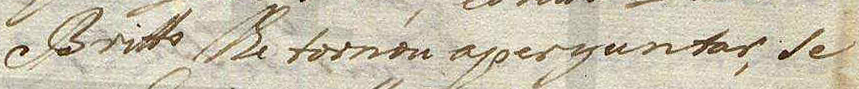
Britto lhe tornou a perguntar, se
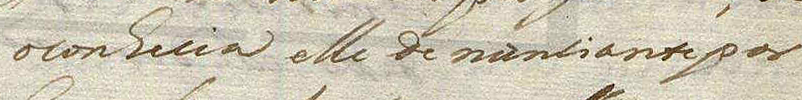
o conhecia elle denunciante por
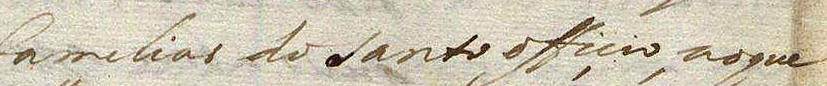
familiar do santo officio, ao que
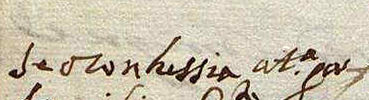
se o conhessia a t.a por
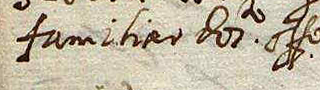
familiar do s.to off.o
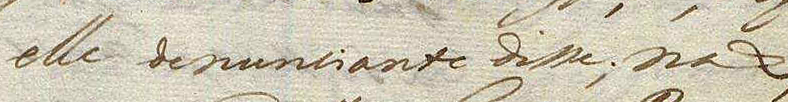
elle denunciante disse; naõ,
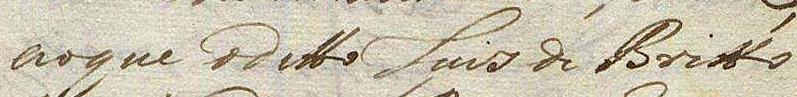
ao que o ditto Luis de Britto
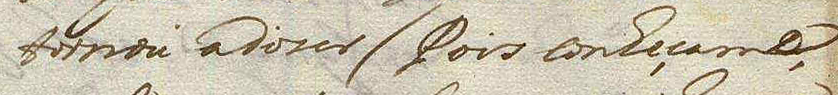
tornou a dizer (Pois conheçame,
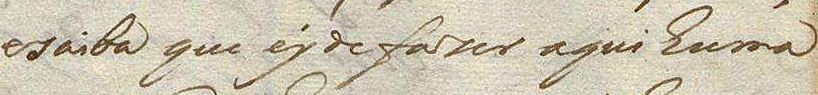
e saiba que ey de fazer aqui huma
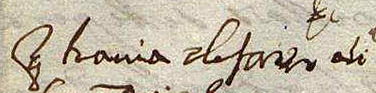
q̄ hauia de fazer ali
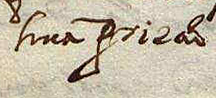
huā prizaõ
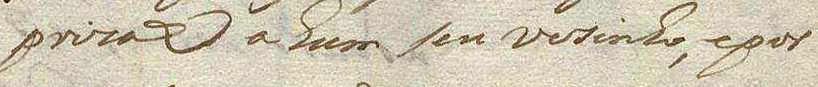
prizaõ a hum seu vezinho, e por
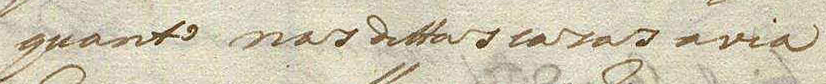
quanto nas dittas cazas avia
